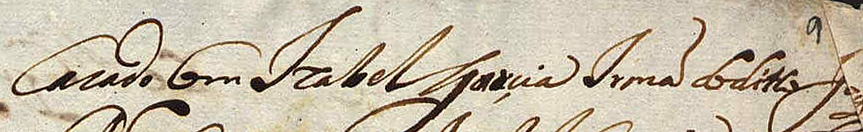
Cazado Com Izabel Garcia Irmã do ditto J
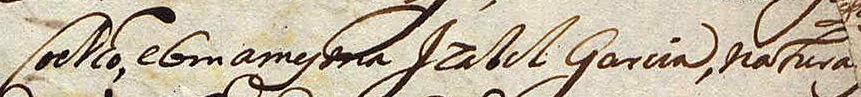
Coelho, e com a mesma Jzabel Garcia, natura
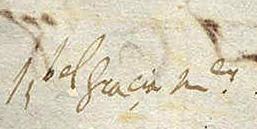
Izbel Gracia m.er
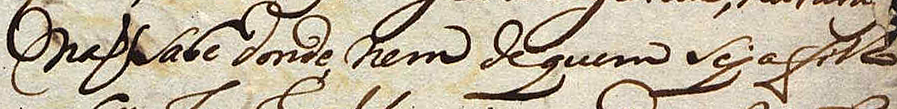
naõ sabe donde nem de quem seja filho
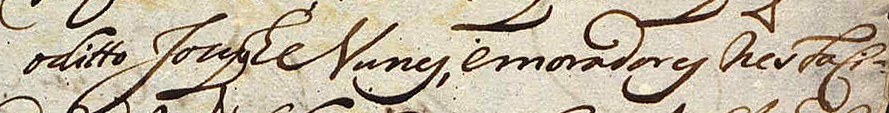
o ditto Jozeph Nunes, e moradores nesta Ci
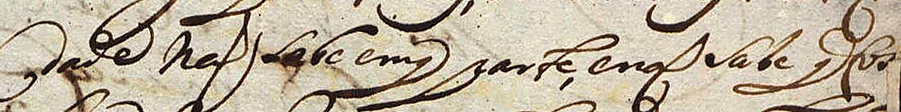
dade naõ sabe em q̄ parte, e naõ sabe q̄ fos
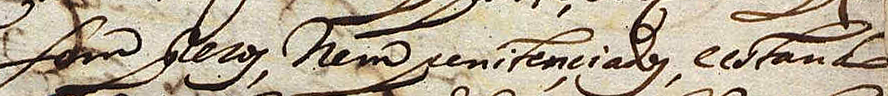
sem pRezos, Nem penitenciados, e estando
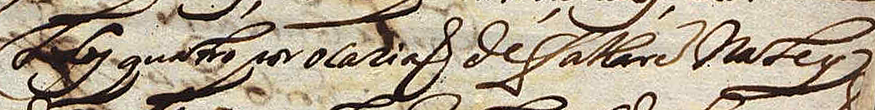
todos quatro por ocaziaõ de fallarē Na Ley
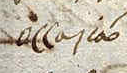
occaziaõ
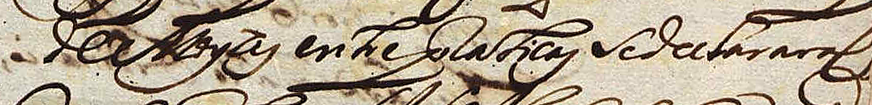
de Moyzes entre pRaticas se declararaõ
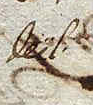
decl.
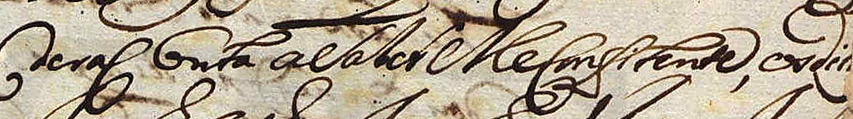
deraõ Conta a Saber elle Confitente, e os dit
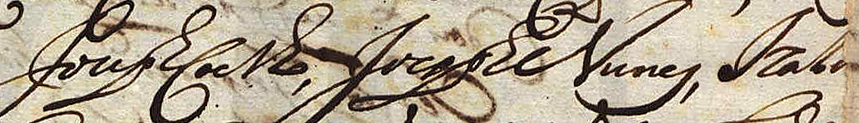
Jozeph Coelho, Jozeph Nunes, Izabe
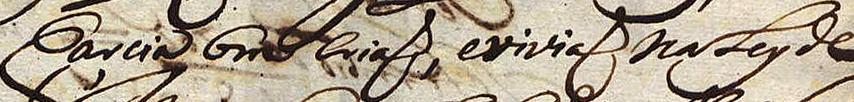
Garcia Como Criaõ, e viviaõ na Ley de
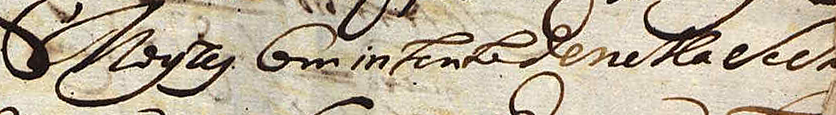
Moyzes Com intento de nella Se Sa
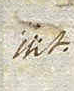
int.
